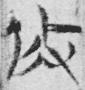攸攸
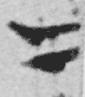攸（逐）
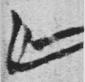亡
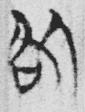咎
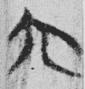六
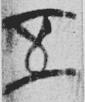五
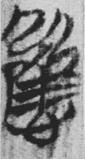○（弗）
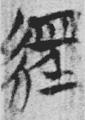經
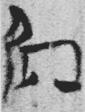凥
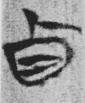貞
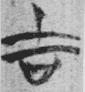吉
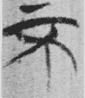不
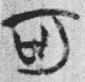可
